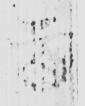百
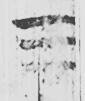三
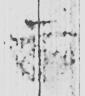百
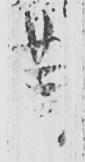廿=
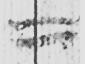二
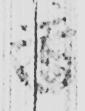百
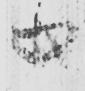四
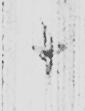十
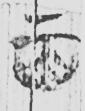百
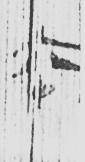{六十}
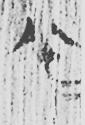八十=
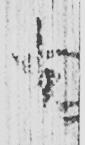七十=
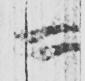二
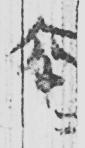六十=
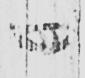四
